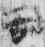司
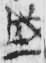城
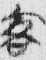客
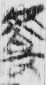○（且）
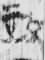政（征）
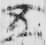五
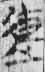連
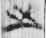之
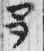邑
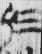於
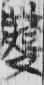○（葬）
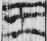王
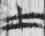士
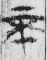不
